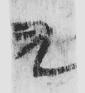九
